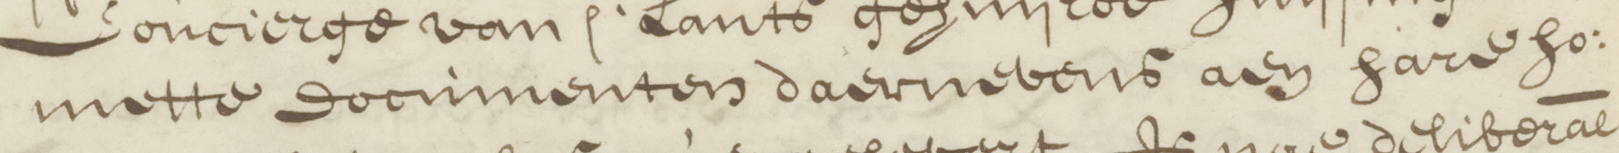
mette Documenten daernevens aen hare ho:
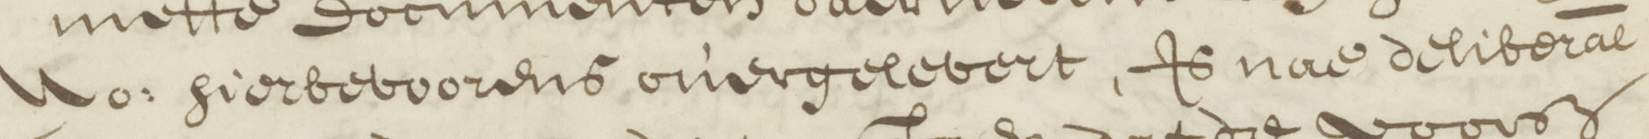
Mo: hierbevoorens ouergelevert, Is nae deliberae.
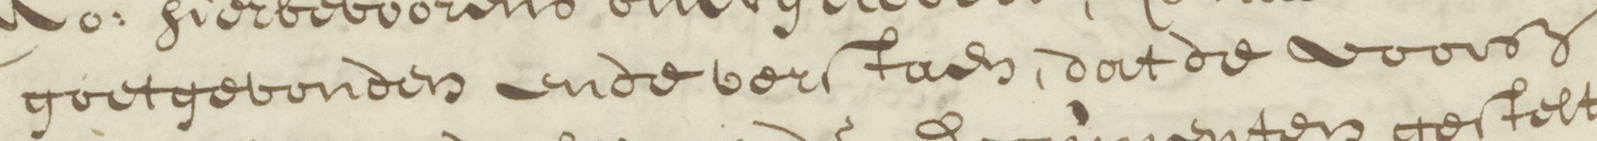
goetgevonden ende verstaen, dat de voorss
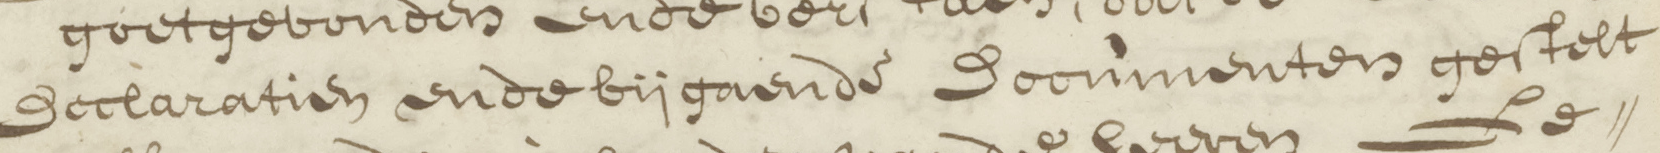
Declaratien ende bijgaende Documenten gestelt
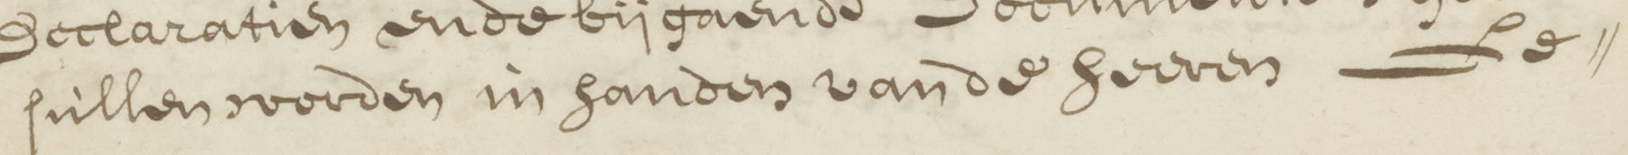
sullen worden in handen van de heeren Ge„
